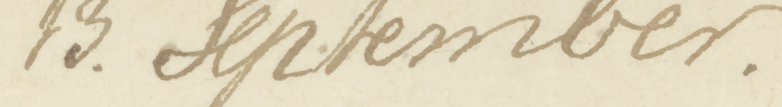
13. September.
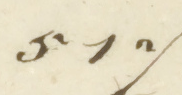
517
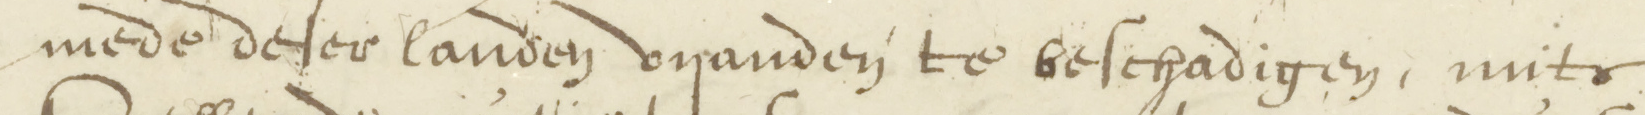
mede deser landen vyanden te beschadigen, mits
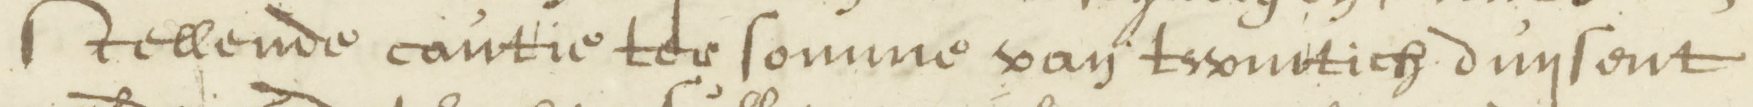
stellende cautie ter somme van twintich duysent
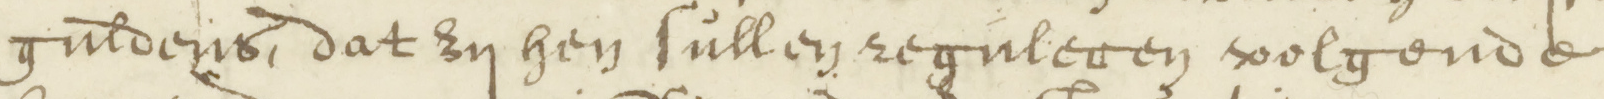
guldens, dat zy hen sullen reguleren volgende
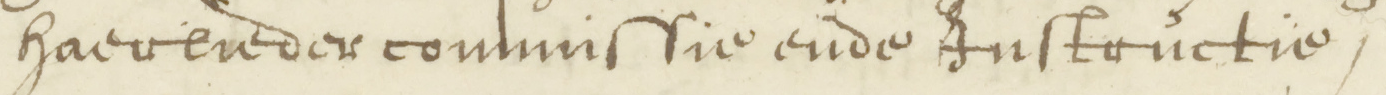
haerlieder commissie ende Instructie.
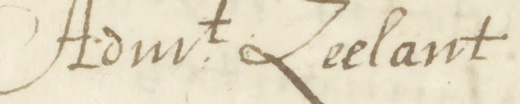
Admt. Zeelant
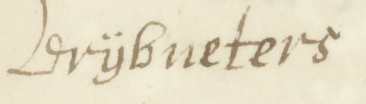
Vrijbueters
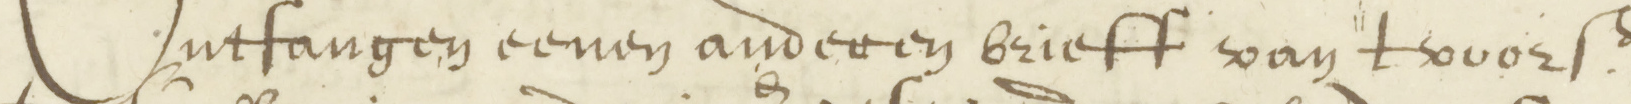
Ontfangen eenen anderen brieff van 't voors
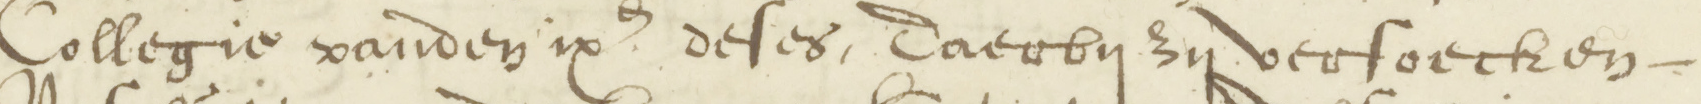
Collegie vanden ixe. deses, daerby zy versoecken
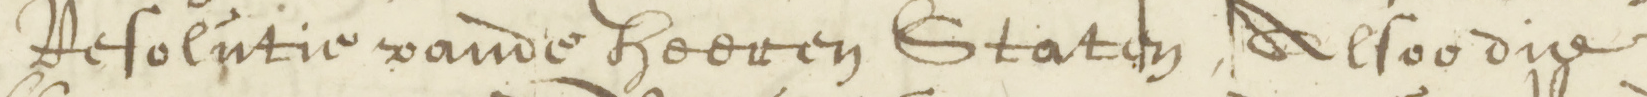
resolutie vande heeren Staten, Alsoo die
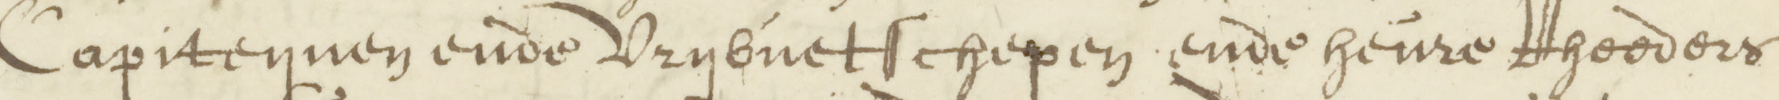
Capiteynen ende Vrybuetschepen ende heure Rheeders
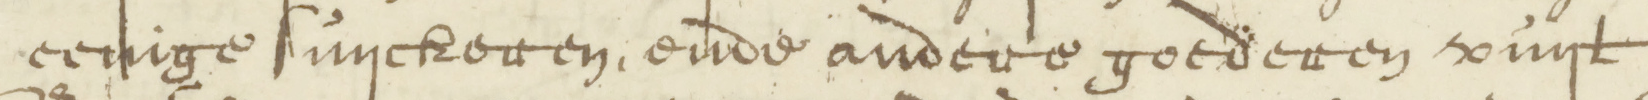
eenige suyckeren, ende andere goederen vuyt
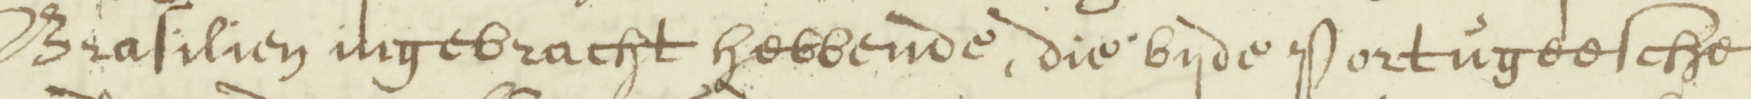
Brasilien ingebracht hebbende, die byde Portugeesche
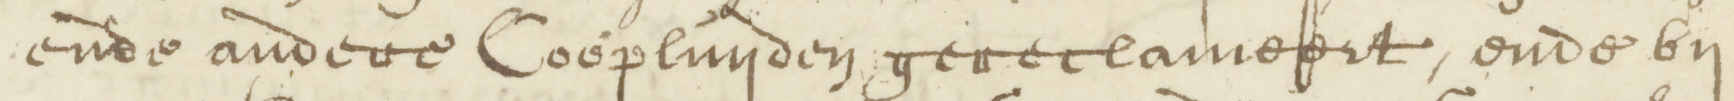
ende andere Coopluyden gereclameert, ende by
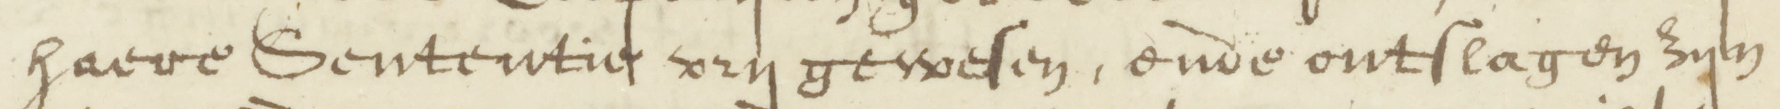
haere Sententie vry gewesen, ende ontslagen zyn
